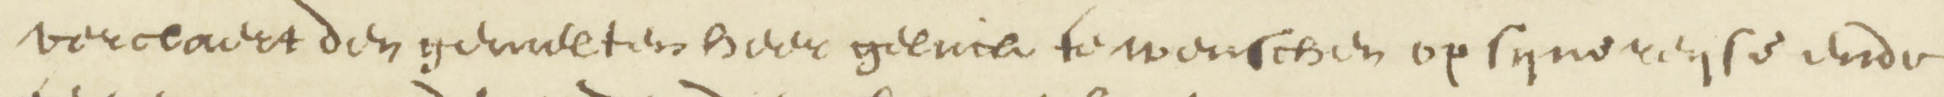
verclaert den gemelten heer geluck te wenschen op syne reyse ende
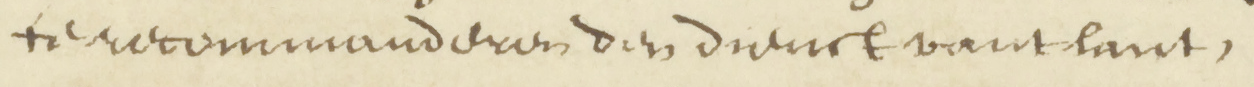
te recommanderen den dienst vant lant.
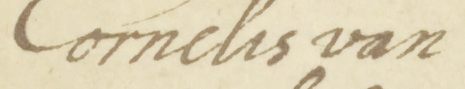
Cornelis van
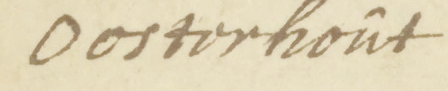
Oosterhout
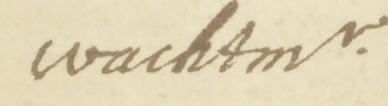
wachtmr.
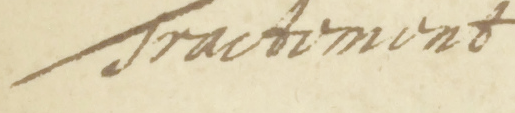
Tractement
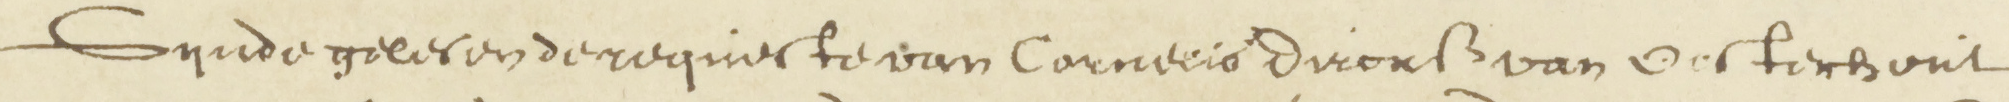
Synde gelesen de requeste van Cornelis Dircxs van Oosterhout
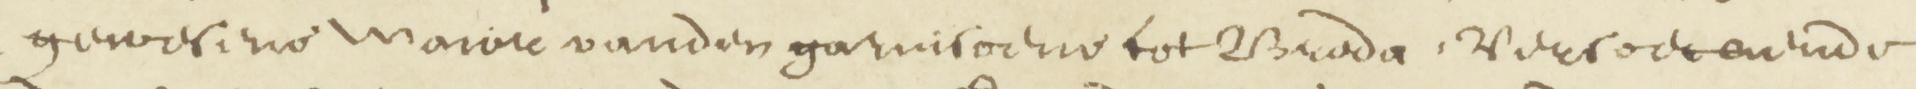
gewesene Maiore vanden garnisoene tot Breda, Versoeckende
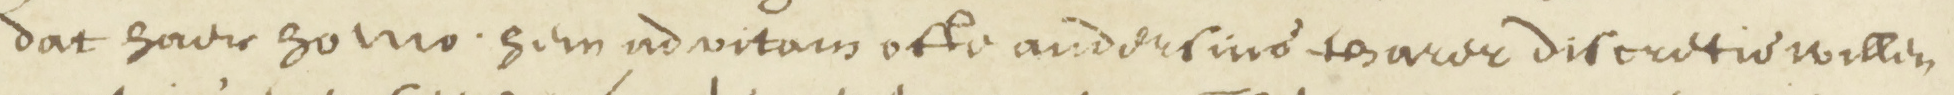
dat haere ho Mo. hem ad vitam ofte andersins tharer discretie willen
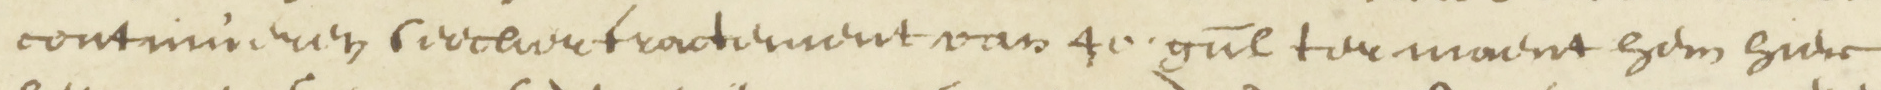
continueren seecker tractement van 40. gul ter maent hem hier
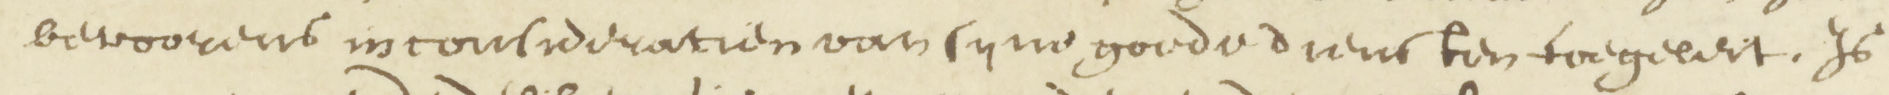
bevoorens inconsideratien van syne goede diensten toegeleit. Is
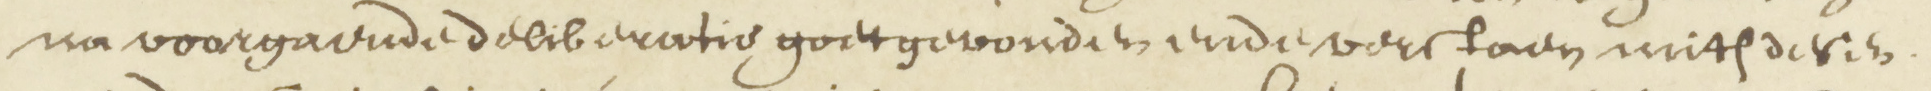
na voorgaende deliberatie goetgevonden ende verstaen mitsdesen
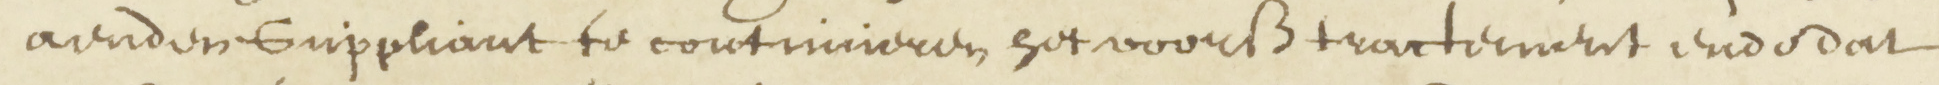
aenden Suppliant te continueren het voors tractement ende dat
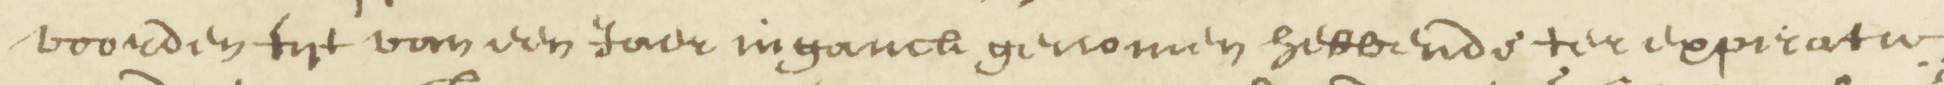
voor den tyt van een Jaer inganck genomen hebbende ter expiratie
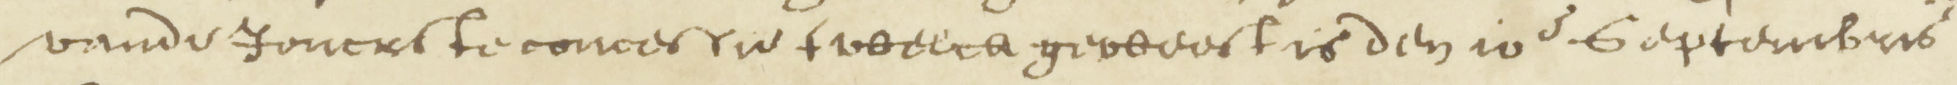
vande Joncxste concessie twelck geweest is den 10en Septembris
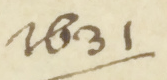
1631.
